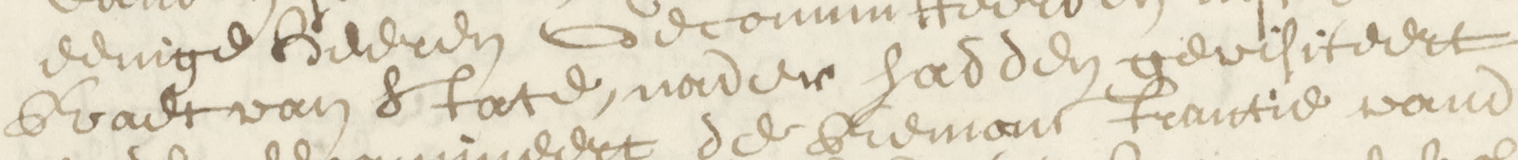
Raet van State, nader hadden gevisiteert
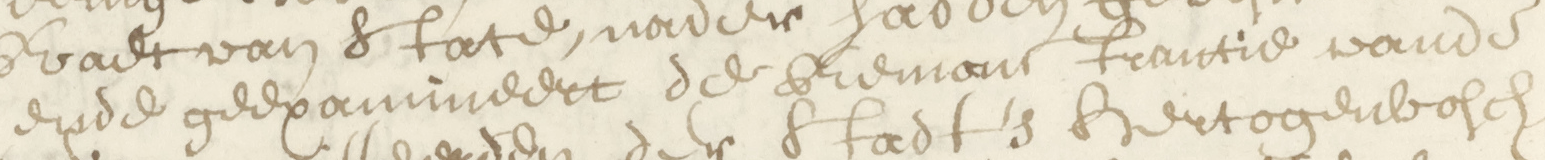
ende geexamineert de Remonstrantie vande
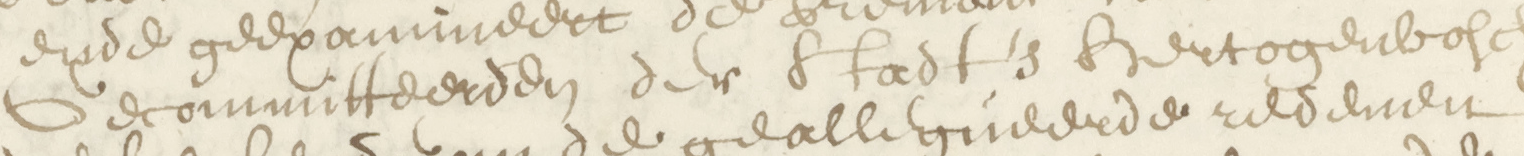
Gecommitteerden der Stadt ‛s Hertogenbosch,
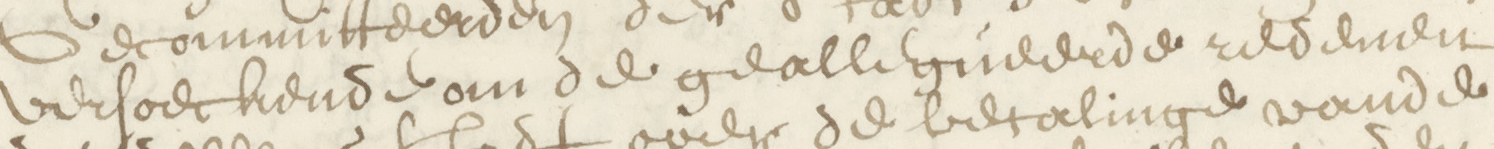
versoeckende om de geallegueerde redenen
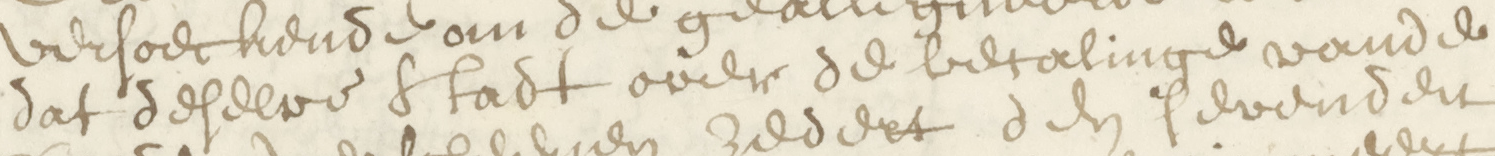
dat deselve Stadt over de betalinge vande
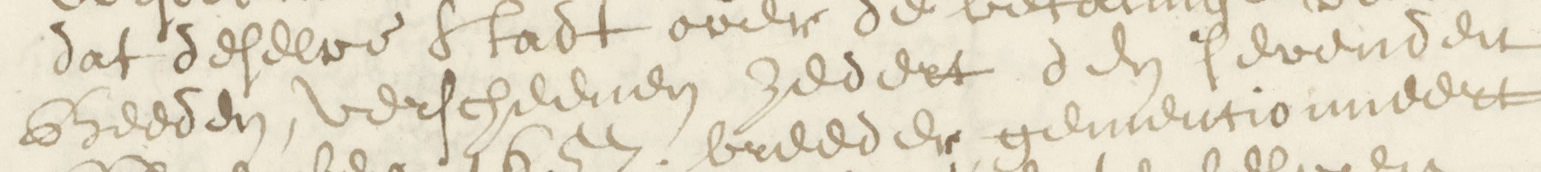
Beeden, verscheenen zedert den sevenden
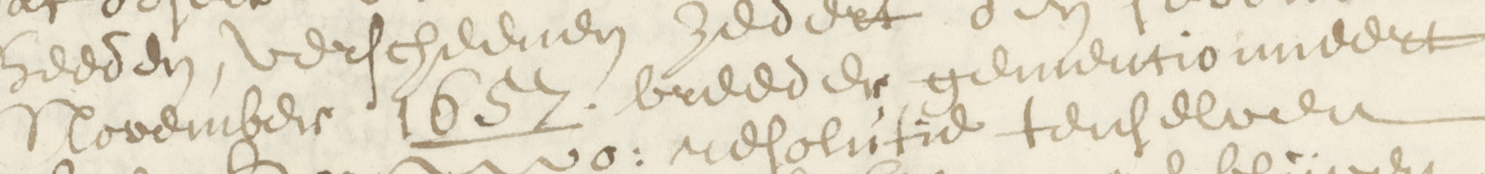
November 1657. breeder gementionneert
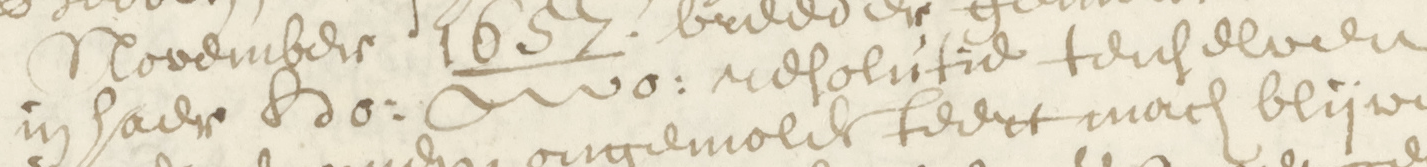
in haer Ho:Mo: resolutie tenselven
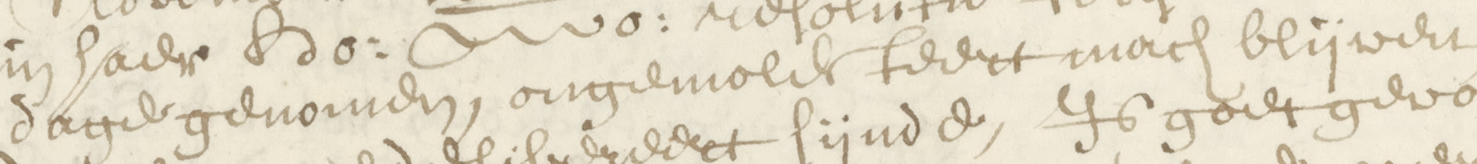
dage genomen, ongemolesteert mach blijven,
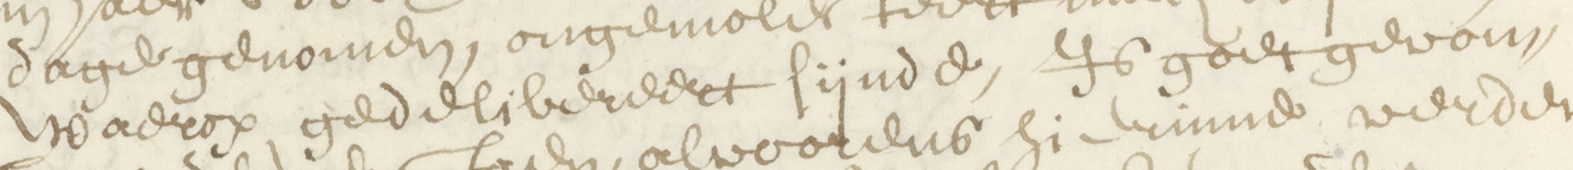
Waerop gedelibereert sijnde, Is goetgevon„
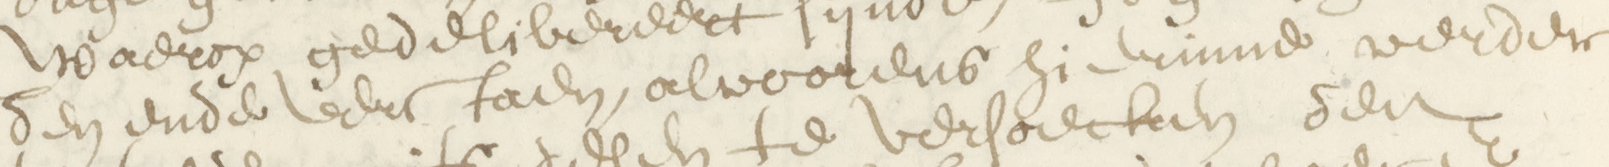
den ende verstaen, alvoorens hierinne verder
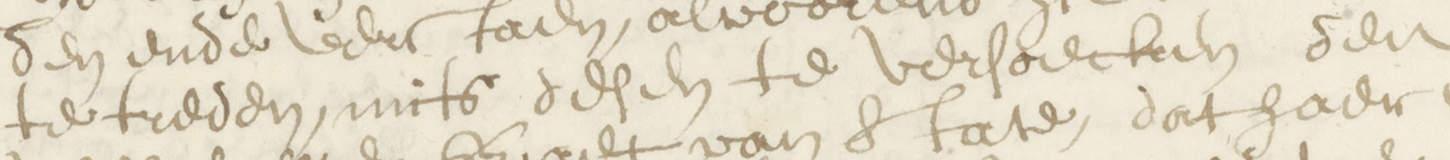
te treden, mits desen te versoecken den
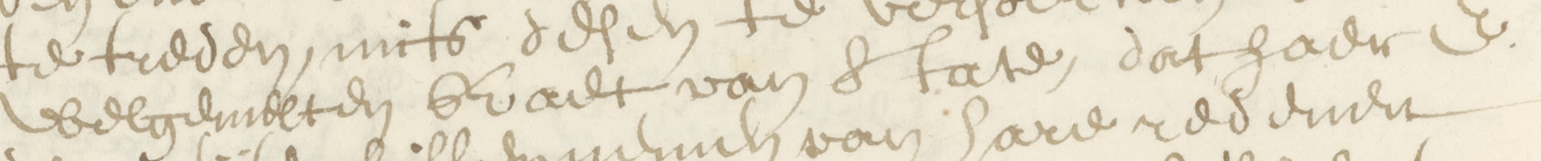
welgemelten Raet van State, dat haer E.
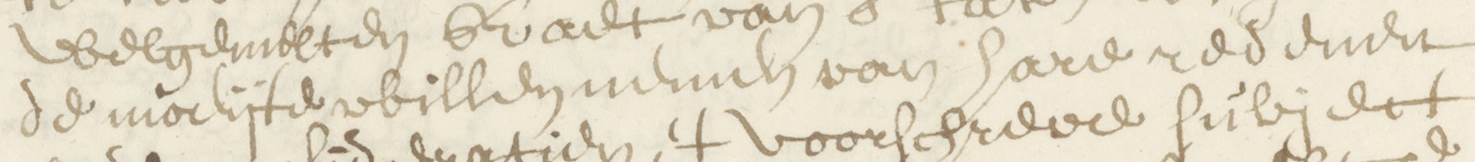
de moeijte willen nemen van hare redenen
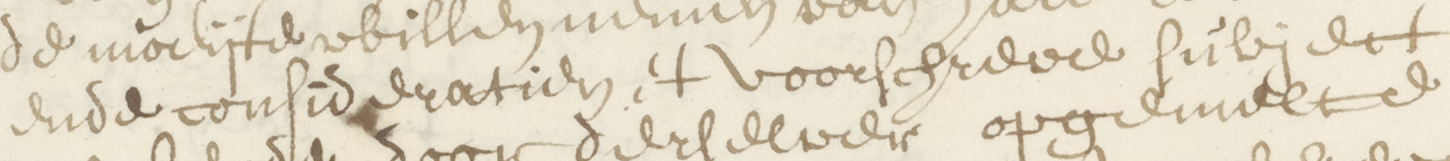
ende consideratien, ‛t voorschreve subject
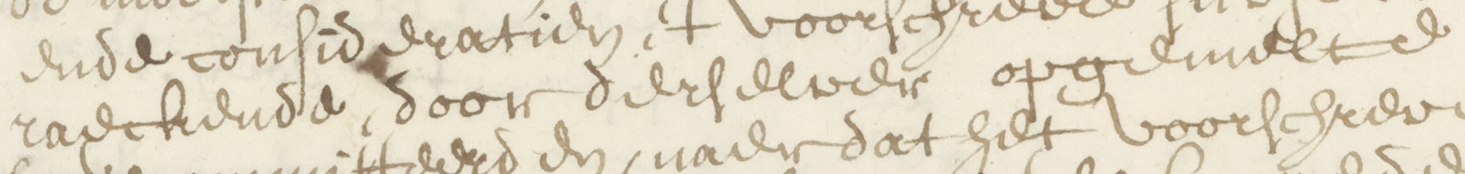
raeckende, door derselver opgemelte
